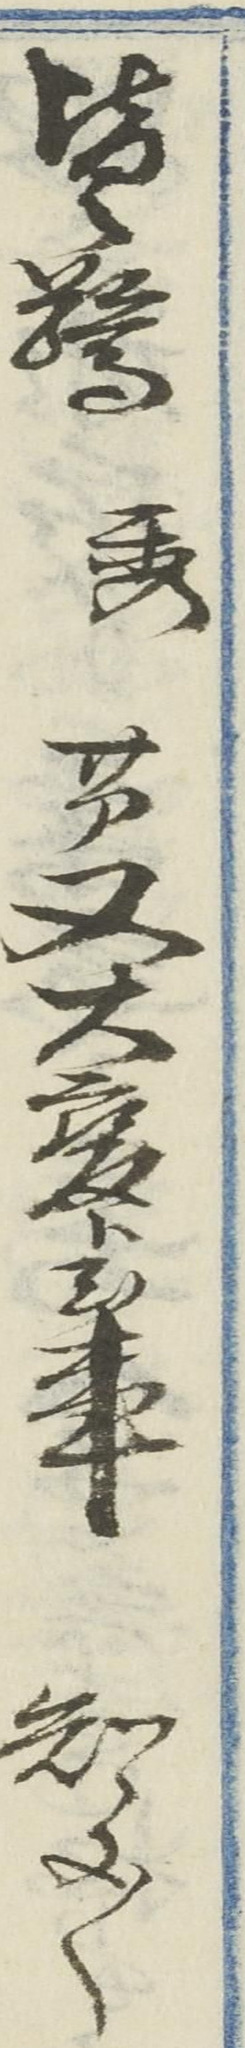皆々驚秀サア又大変ト云事知らヌ〳〵
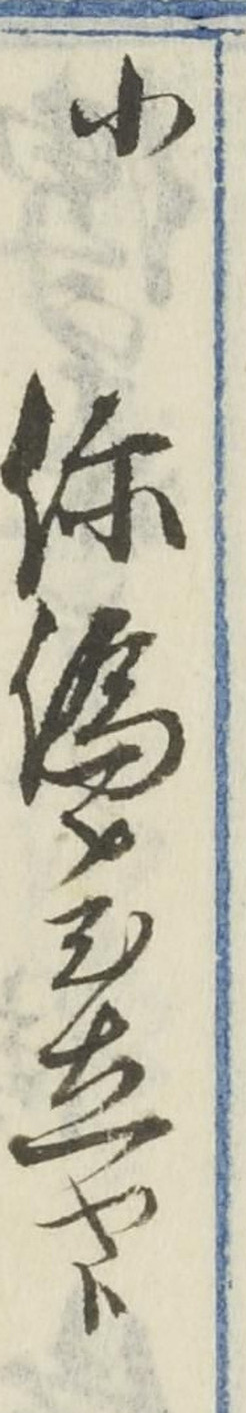小你偽ヲ云立ヤト
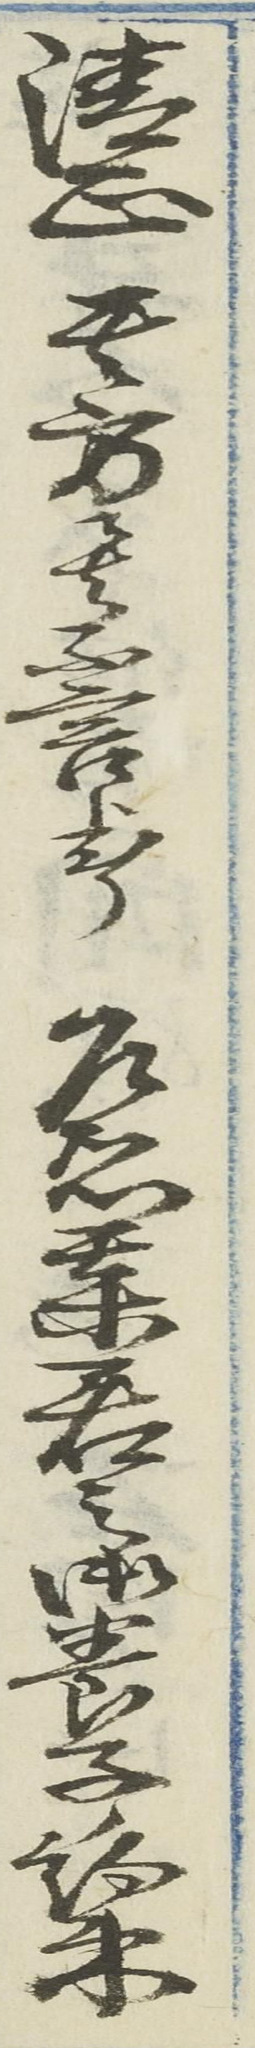清正其方二は不言ト云う乍恐某君之御養子ノ約束
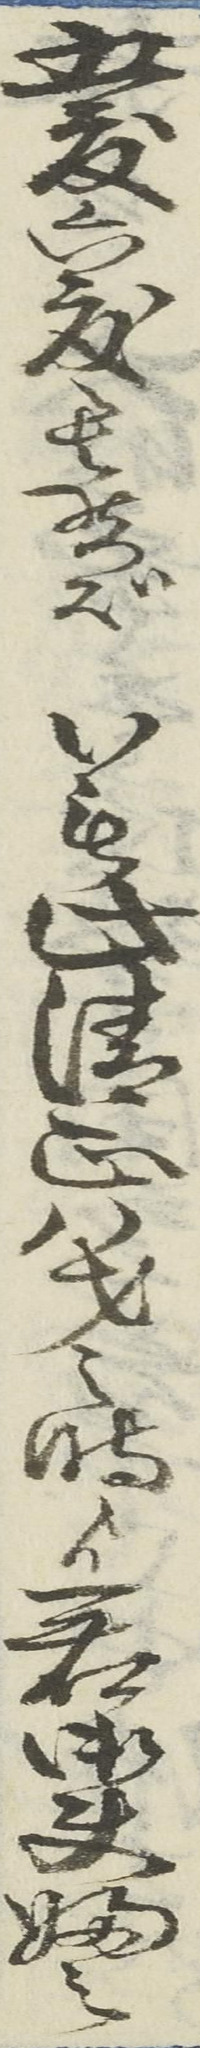五度六度二は候ズいも此清正八才之時ゟ君御夫婦之
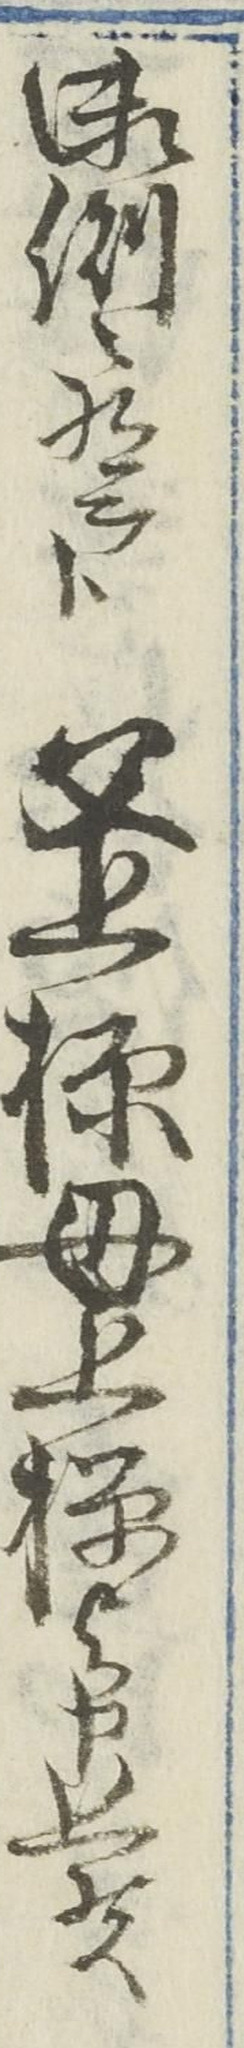御側二有テト父上様母上様と申上候
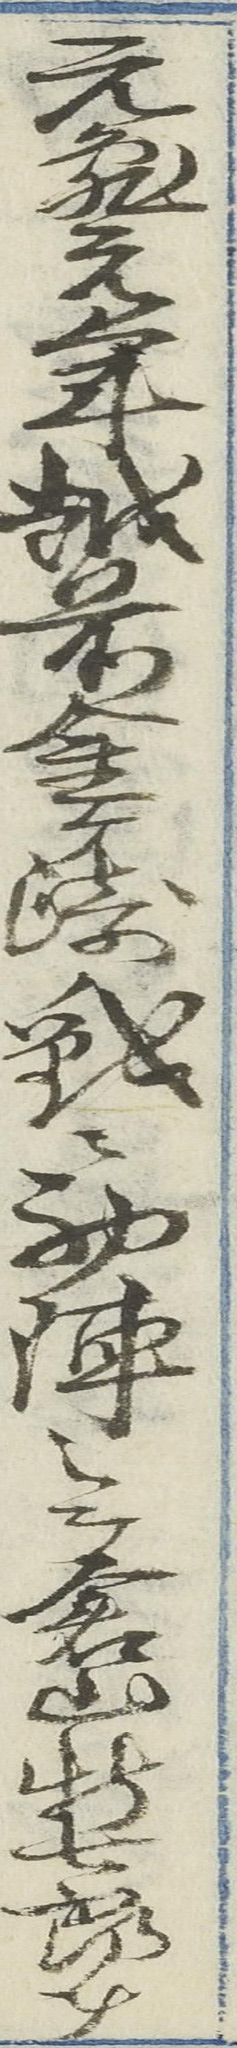元亀元年越前金ヶ崎ノ戦二初陣しテ倉山新七郎ヲ
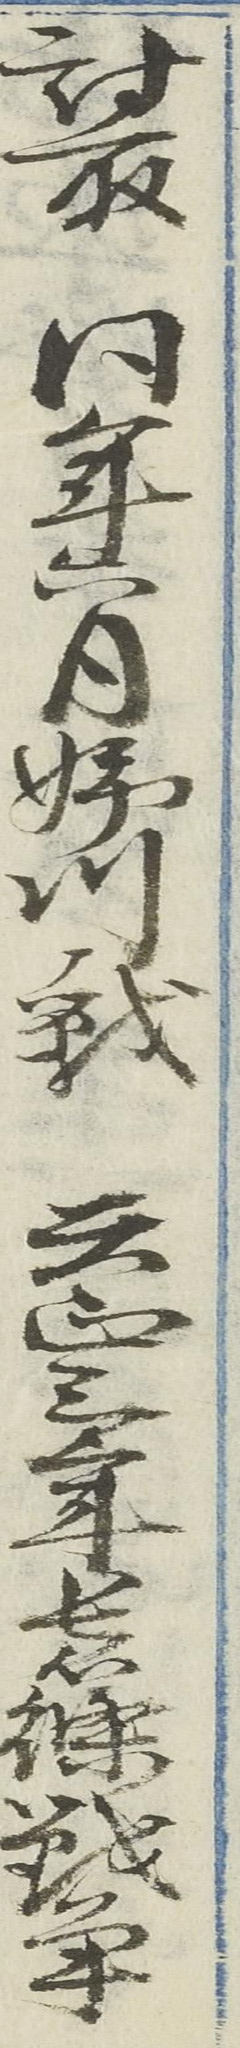討取同年六月姉川ノ戦天正三年長篠戦争
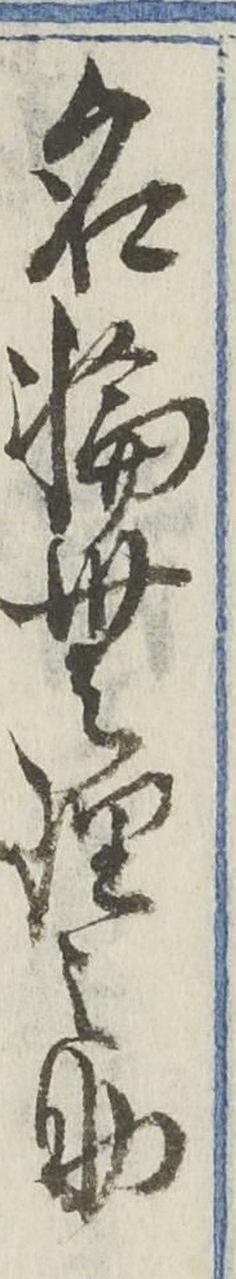名輪無理之助
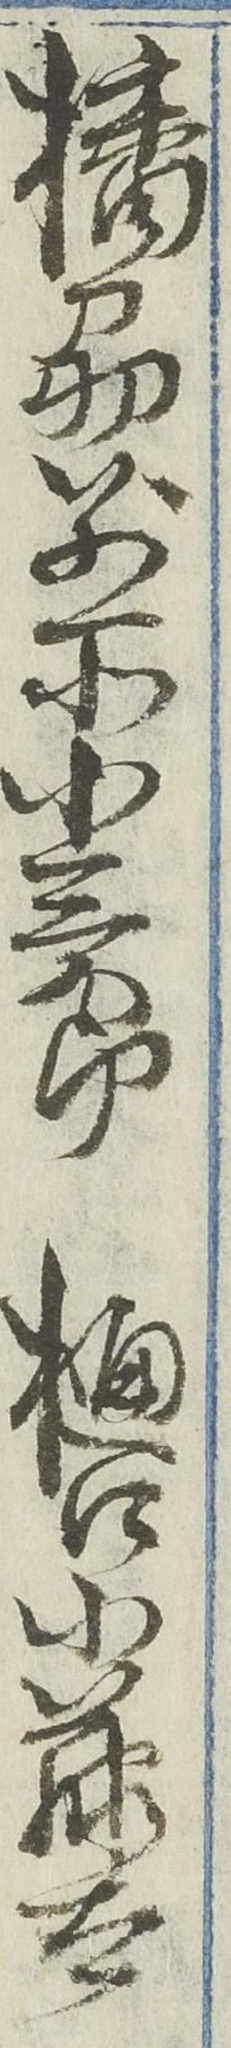播州別所小三郎樋口小藤太
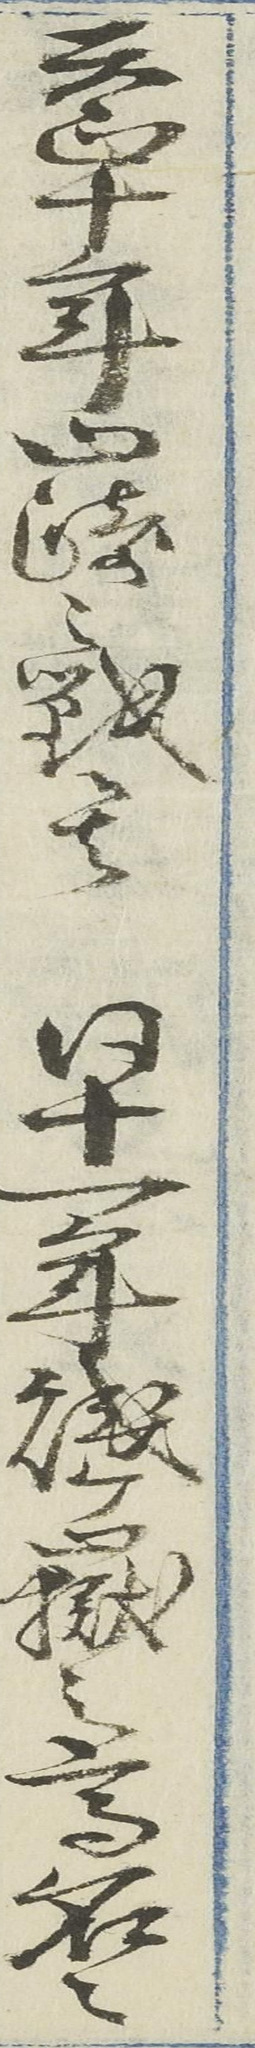天正十年山崎之戦二は同十一年賤ヶ嶽之高名二
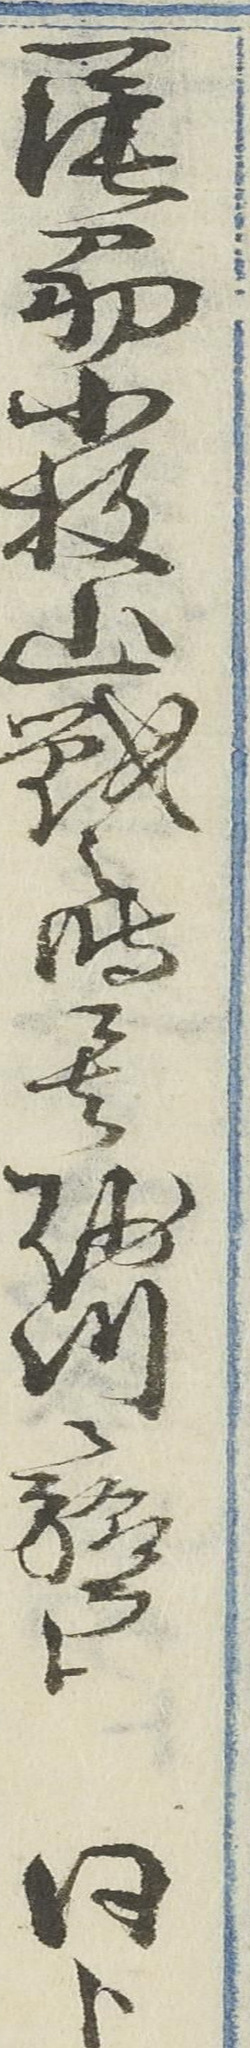尾州小牧山戦之時二は砂川二於テト同ト
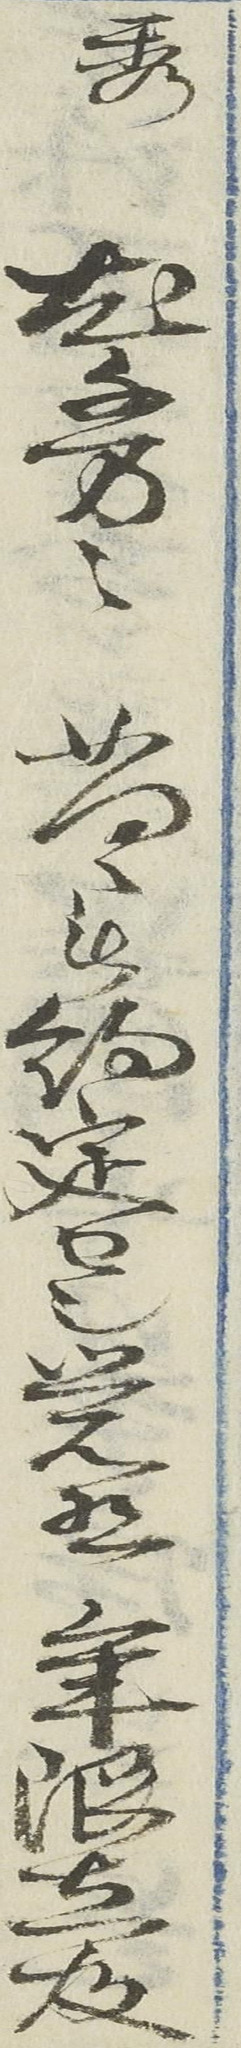秀尤千万之如何二も約定セシ覚有年限立故
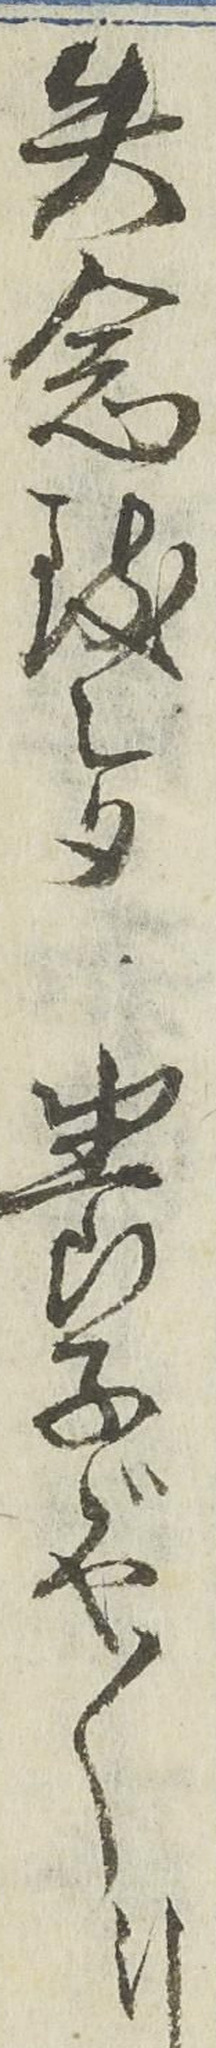失念致シタ養子じや〳〵引

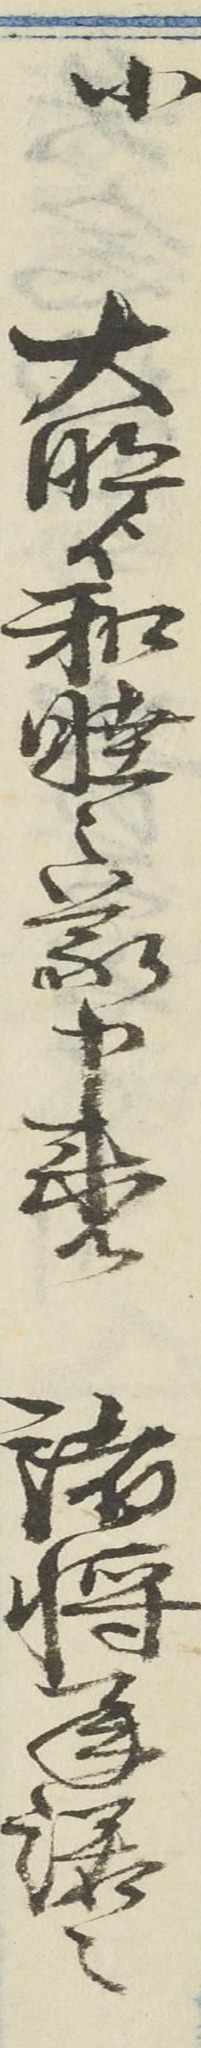小大明ゟ和睦之義申来ル諸将承諾也
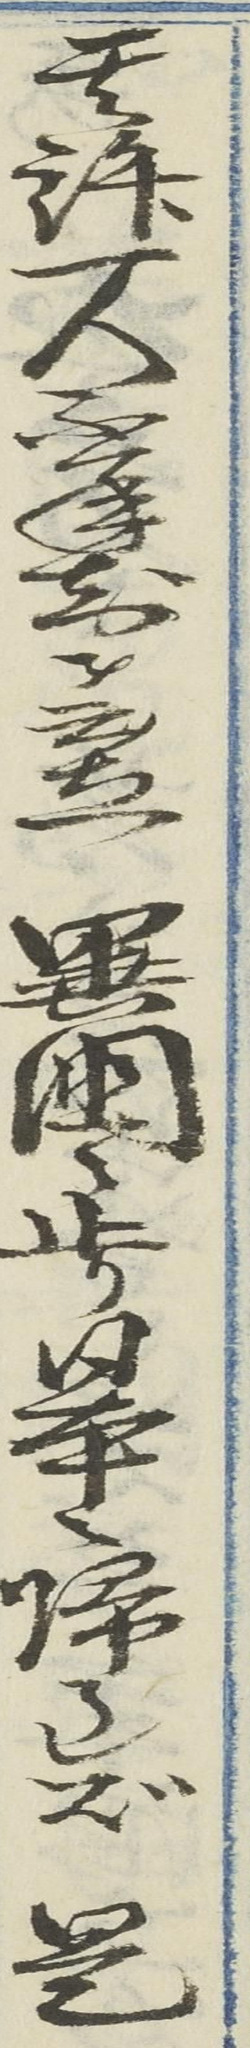其許一人不承知ヲ云立異国ニ止リ日本ニ帰ラレズ是
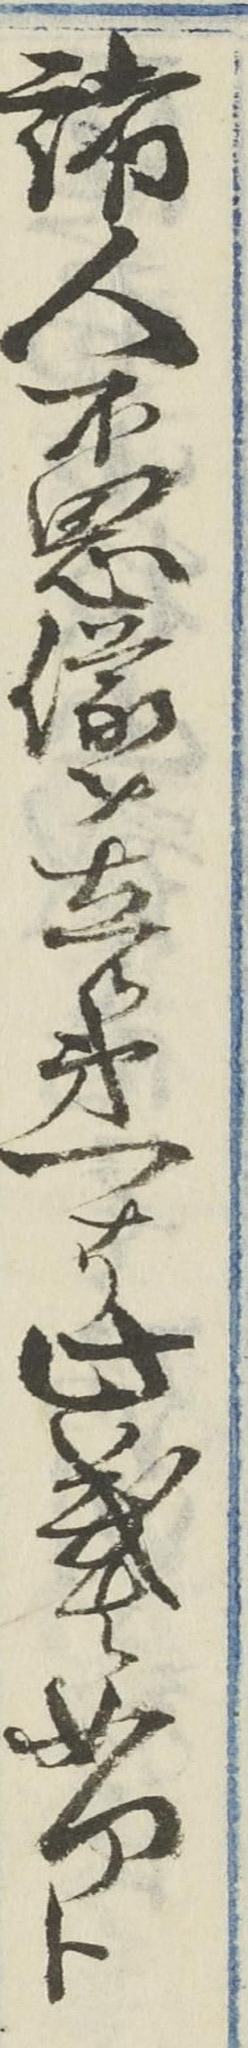諸人不思儀ヲ立ル第一ナリ此義は如何ト
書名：伏水大地震
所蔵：東京大学地震研究所図書室 Earthquake Research Institute Library, The University of Tokyo, JAPAN
